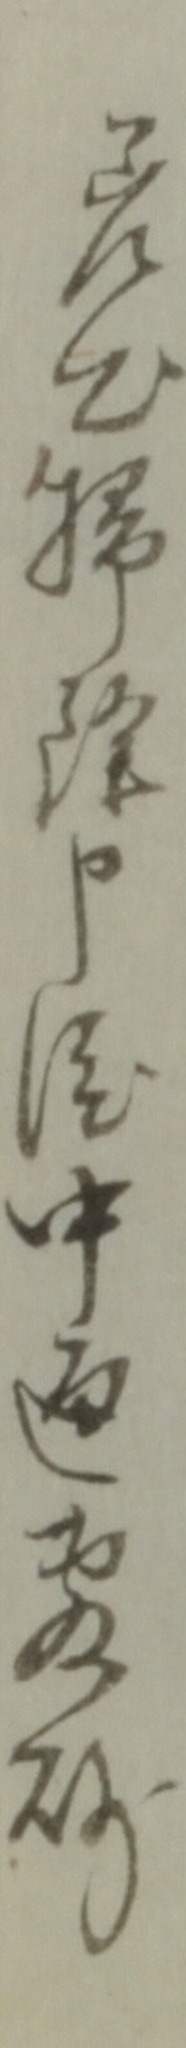差出掃除申渡中通敷砂
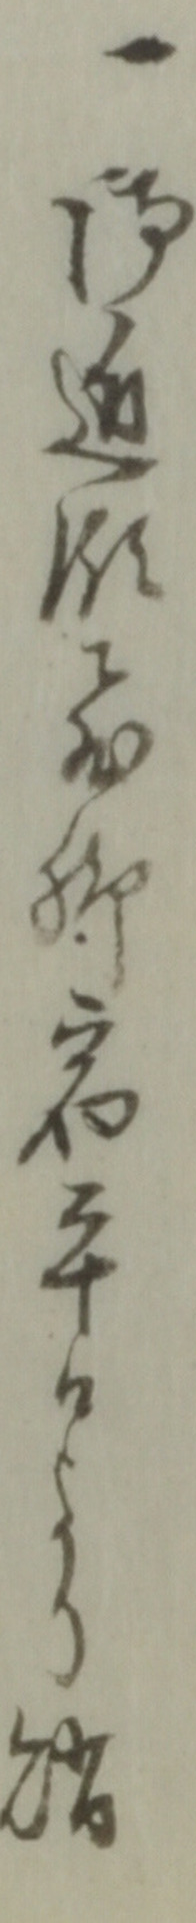一御近領ニ飛脚宿平日より賄
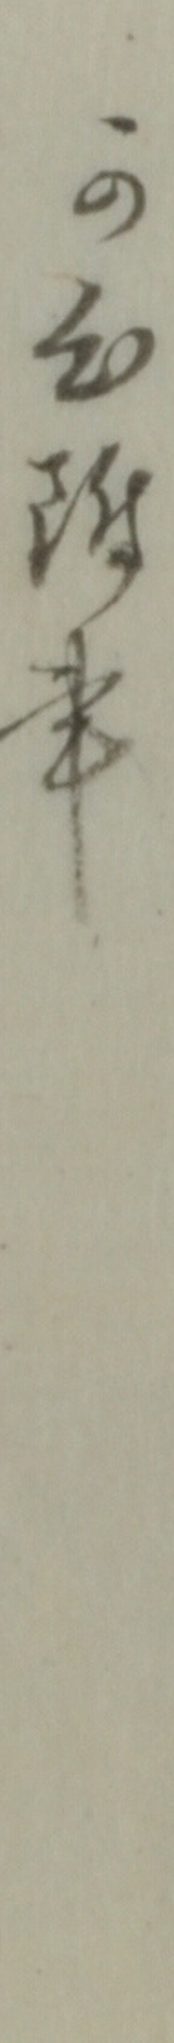可心附事
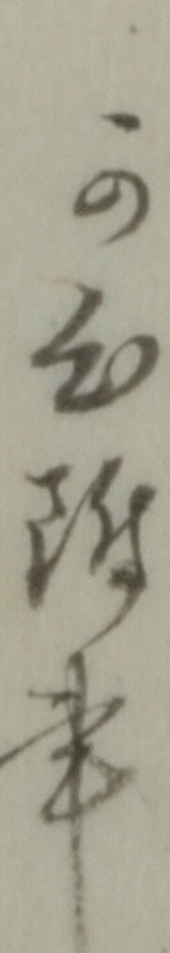可心附事
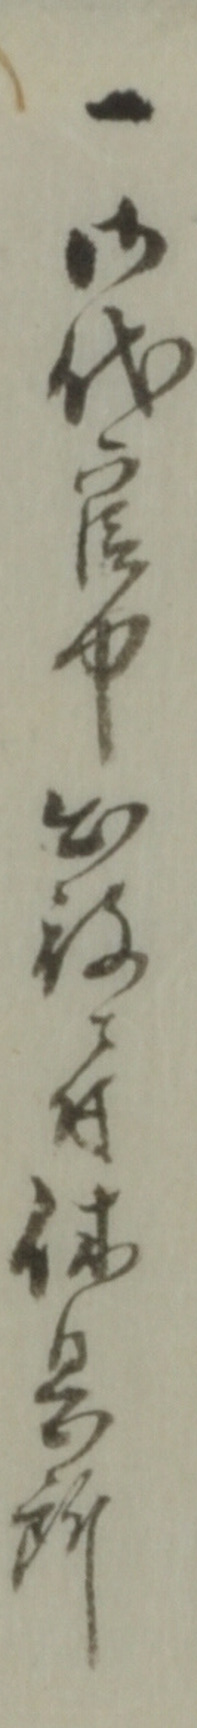一御代官中出役ニ付休日出所
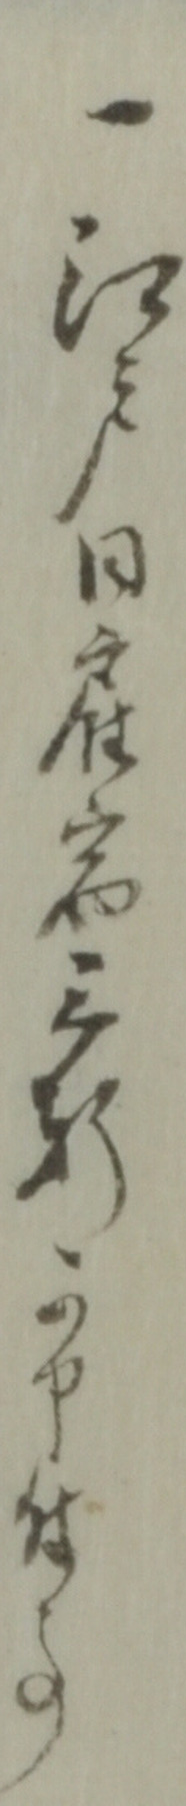一江戸日雇宿三軒可申付候事
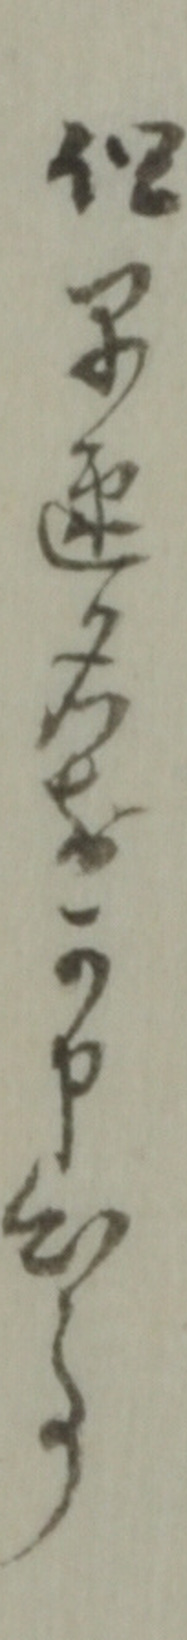但早速名前可申出候事
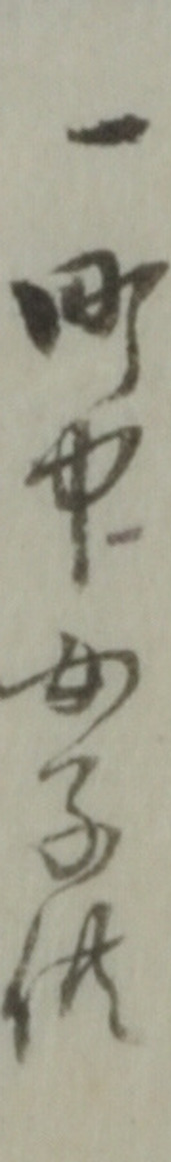一町中女子供
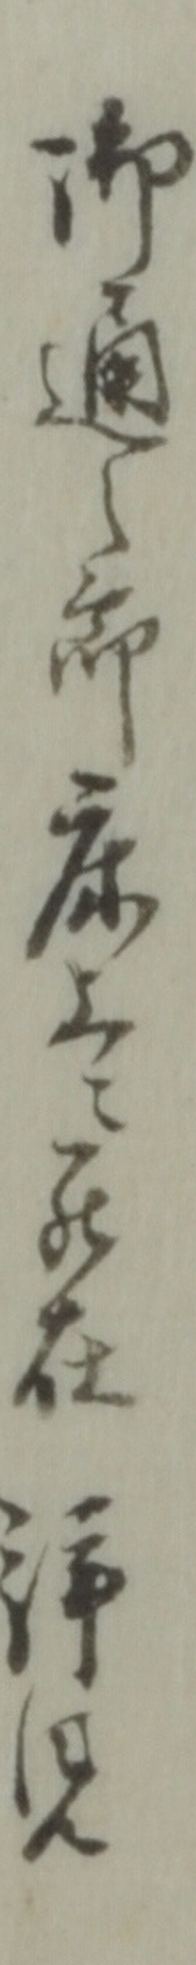御通之節床上ニ罷在拝見
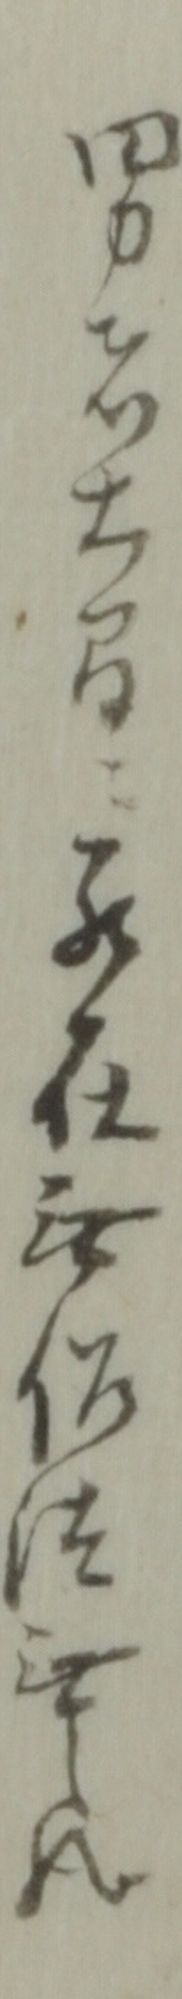男者土間ニ罷在無作法無之様
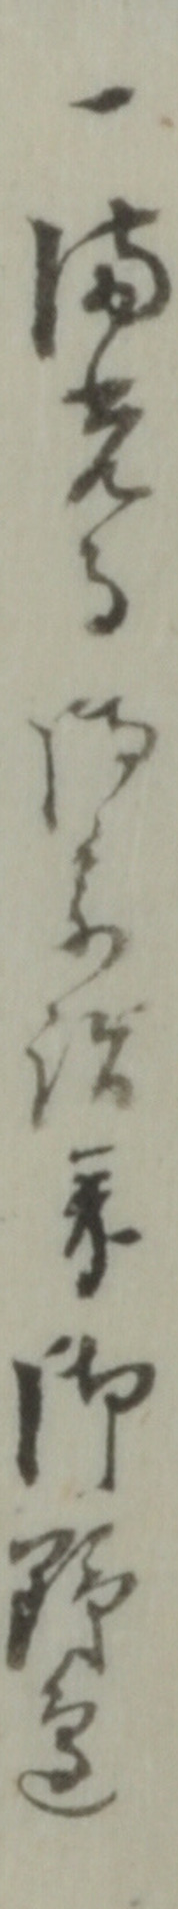一満光寺御参詣并御野辺
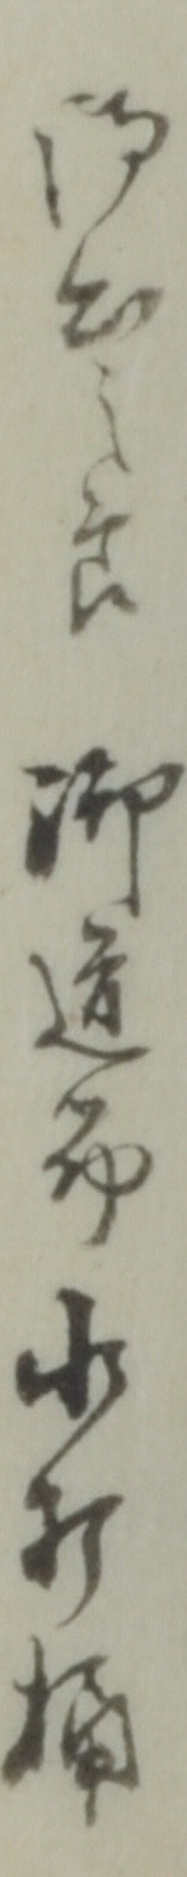御出之節御道筋水打桶

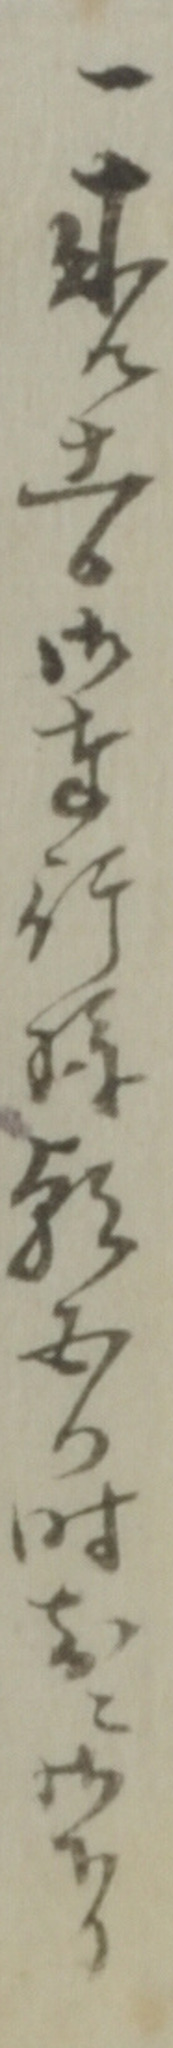一来ル十一日御奉行様朝五ツ時前ニ御下リ
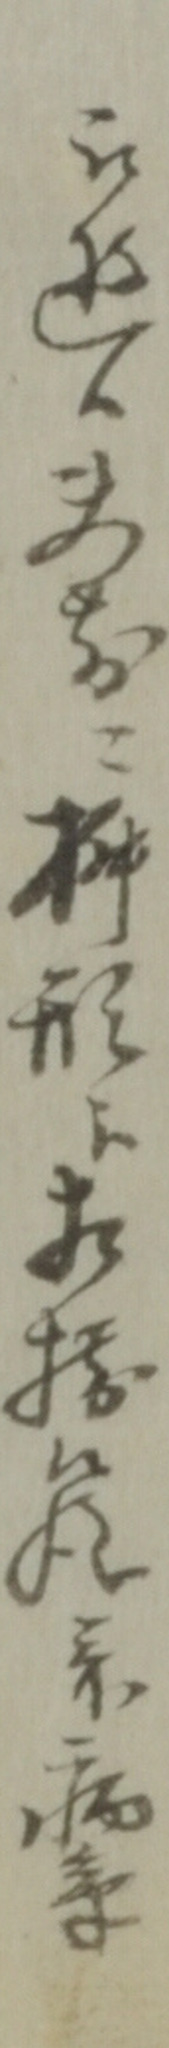被遊候夫前ニ桝形江相揃候様并病気
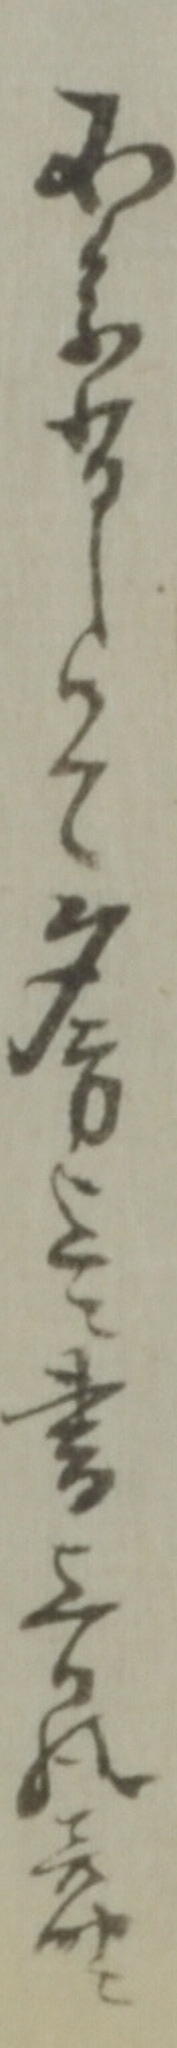不参あり之候ハヽ夕方迄ニ書上候様喜助ニ
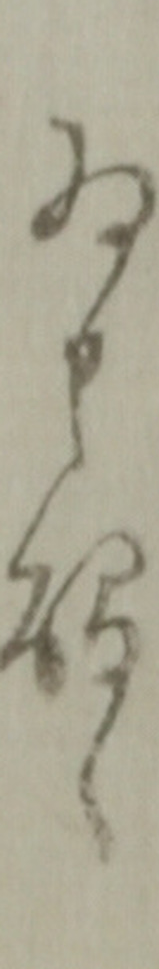為申触候
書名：御初入諸事控
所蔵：伊那市立高遠町図書館・合同会社AMANE
